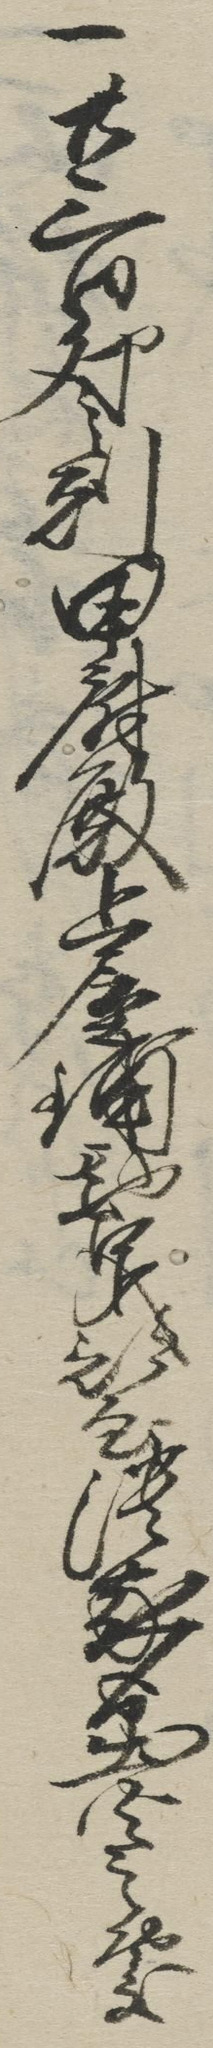一廿三日卯之刻甲府殿上屋鋪初足入部屋潰家ゟ出火之処
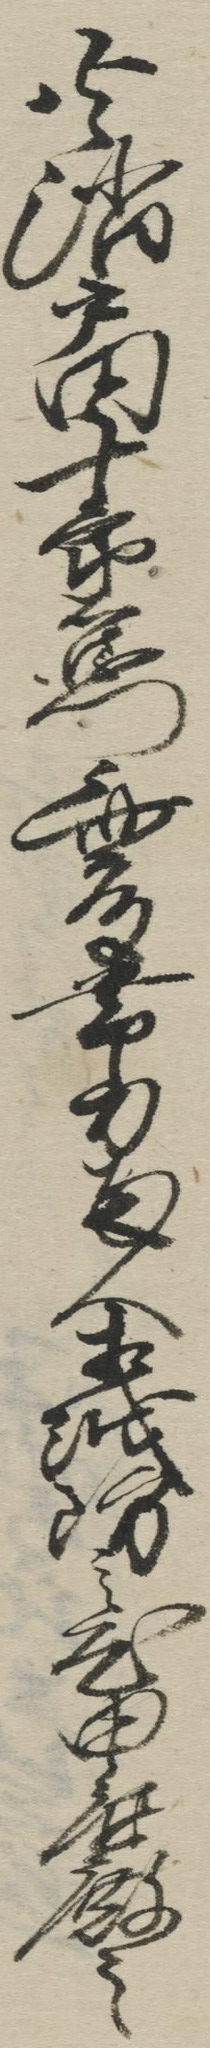火消戸田十郎右衛門無藤帯刀両人相越防之尤甲府殿之
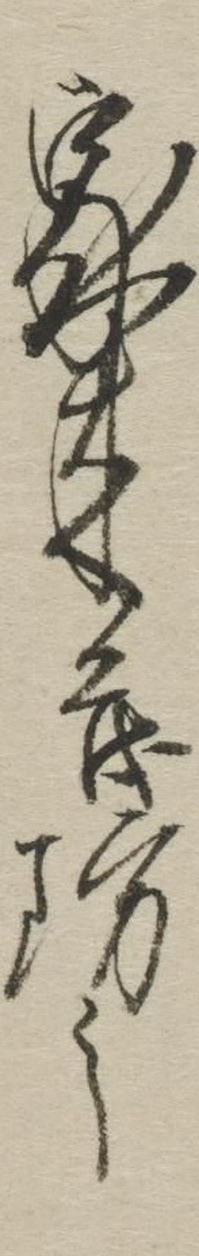家来も防之
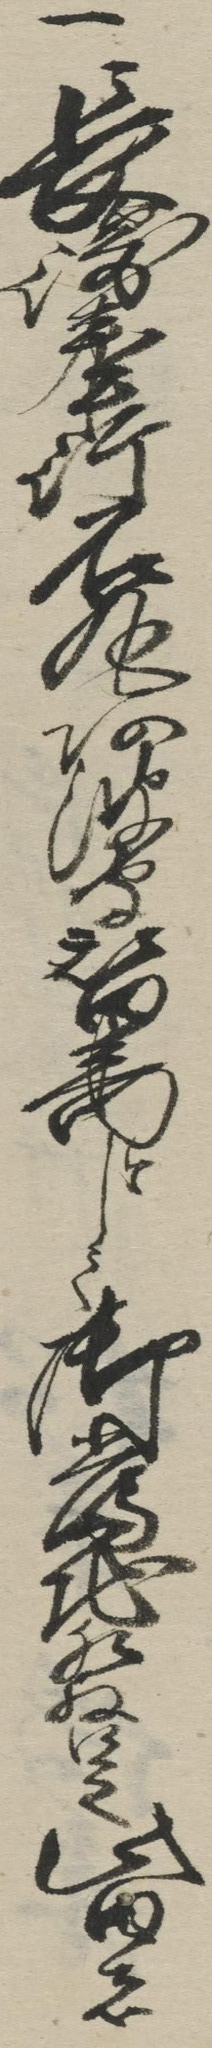一長崎奉行石尾阿波守替番として御当地発足此日は
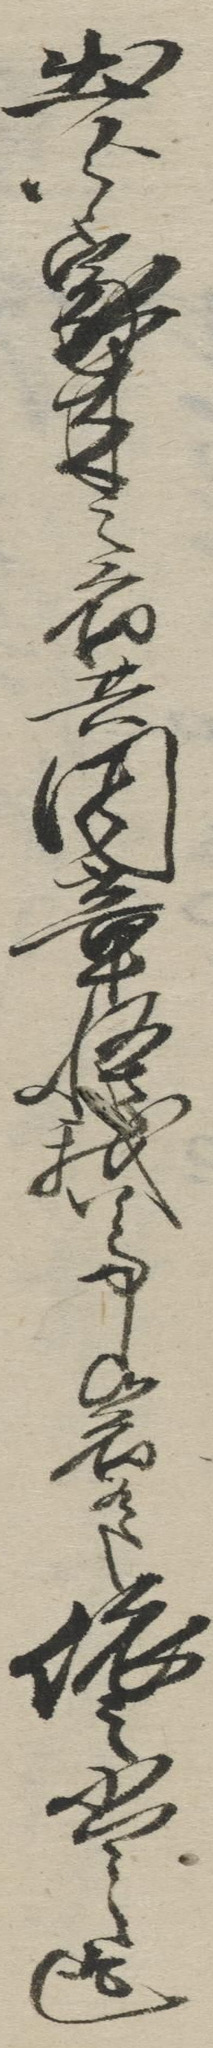出火家来之者共周章怪我いたし候者有之依之書之迄
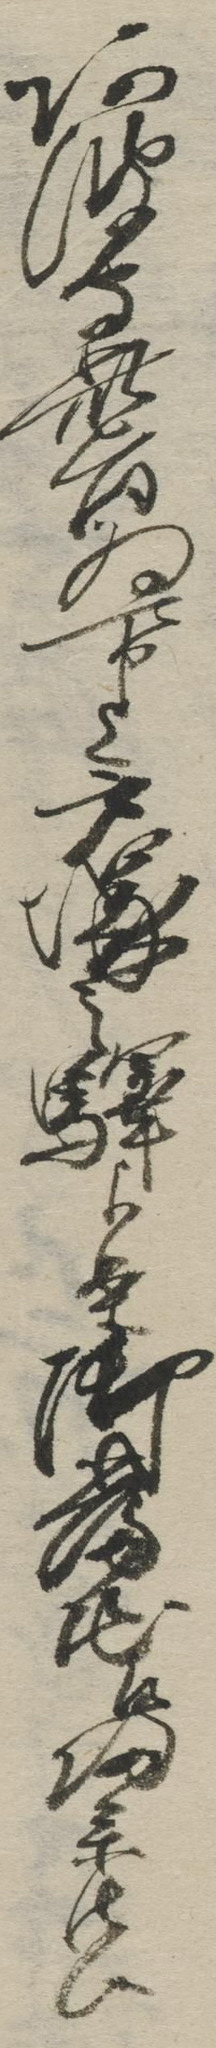阿波守此旨為可申上候戸塚之駅より御当地江帰参仕候
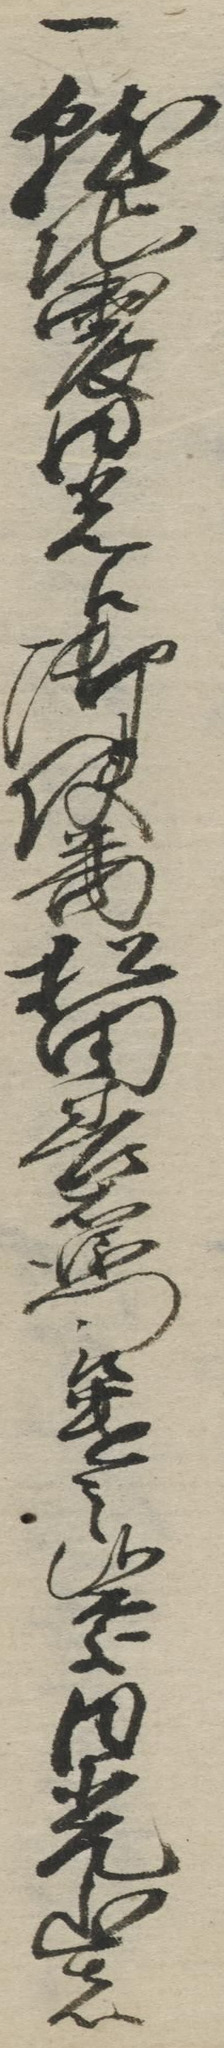一就地震日光江御使者番松田善右衛門被遣之候処日光山は
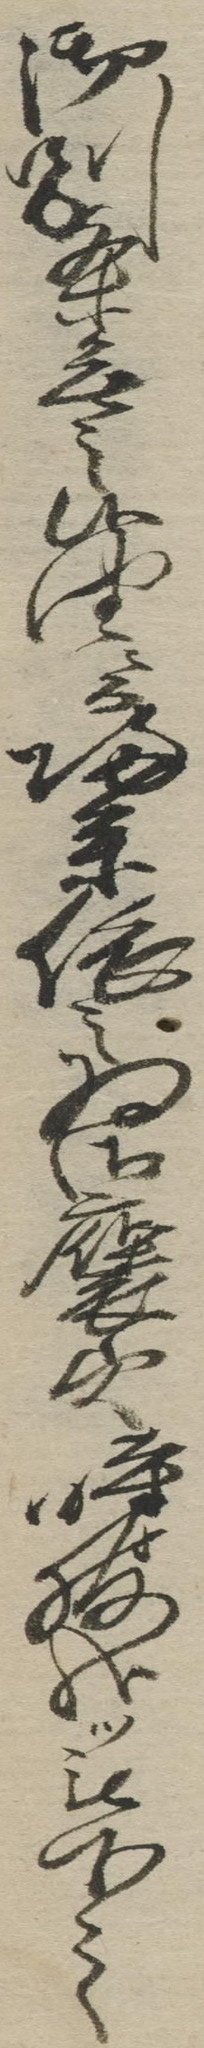御別条無之候由二而帰参依之為褒美時服弐ッ被下之

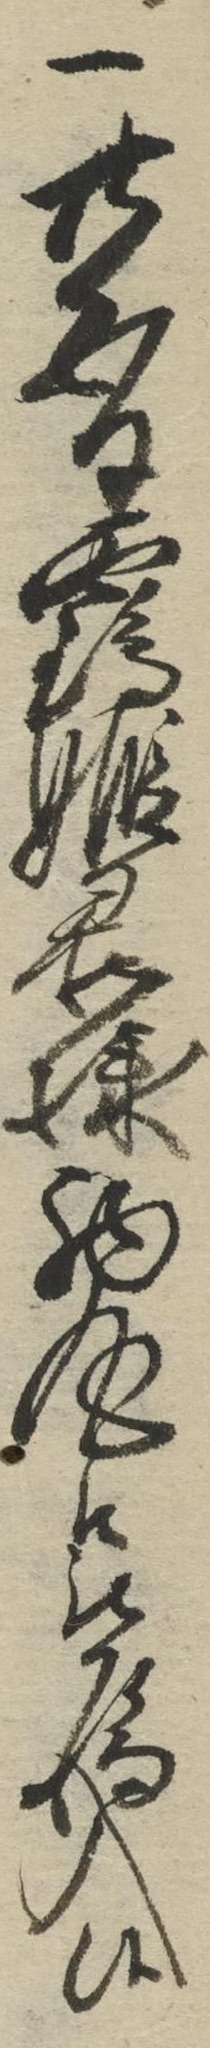一廿五日靏姫君様西丸江被為入候
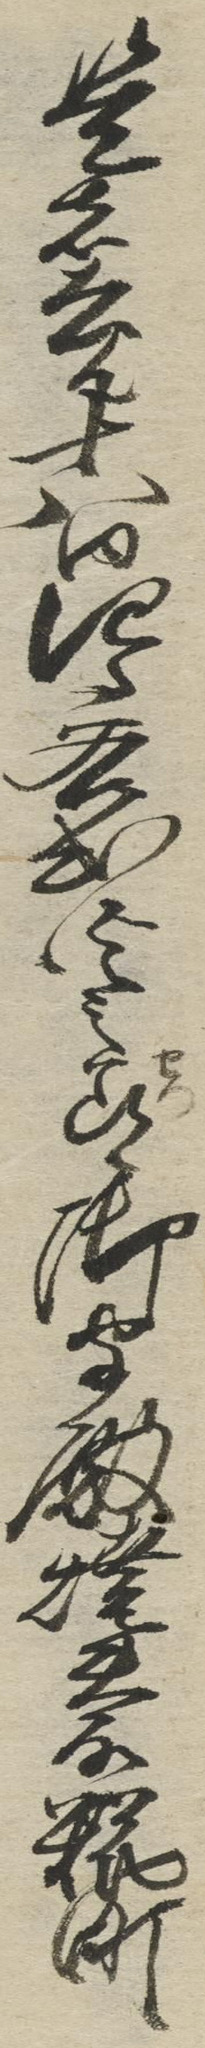是は去々十八日四ッ旭出火之節せつ御守殿焼失故糀町
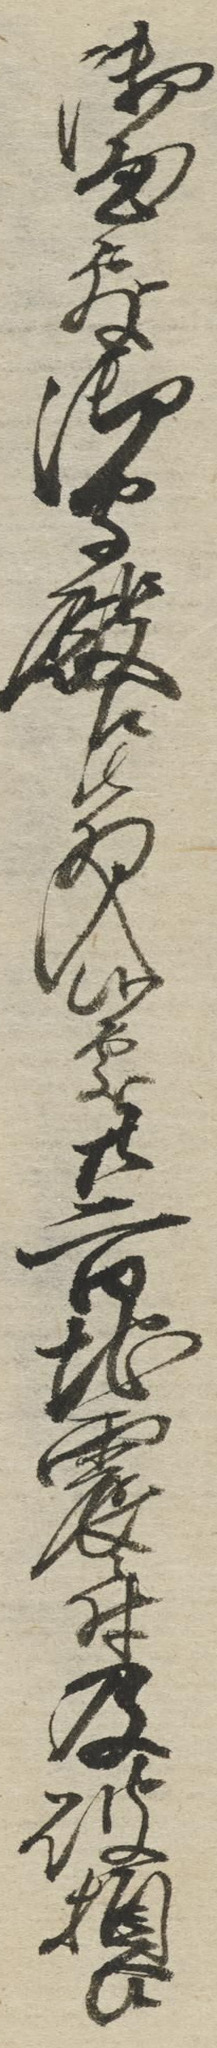御屋敷御守殿江被為入候処廿二日地震二付及破損候
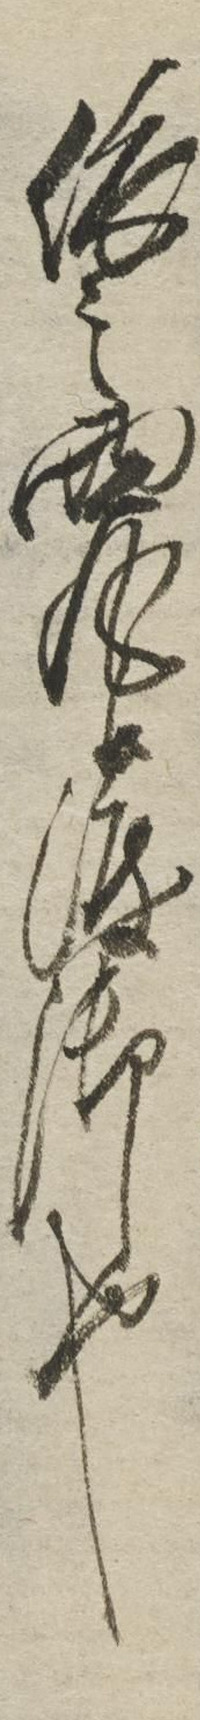依之西丸江渡御也
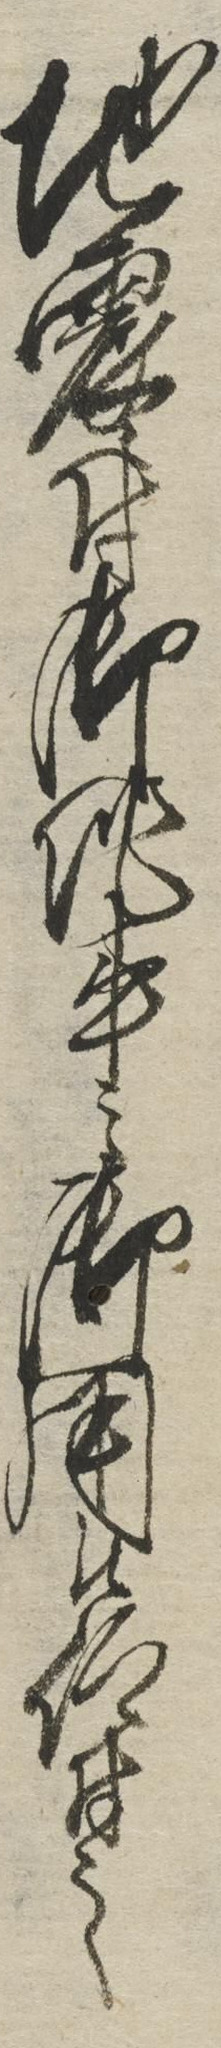地震付御作事之御用被仰付之
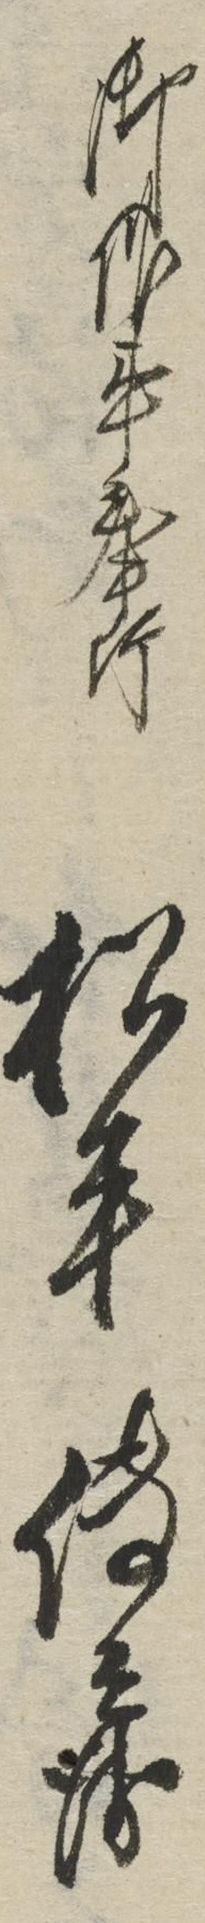御作事奉行松平伝兵衛
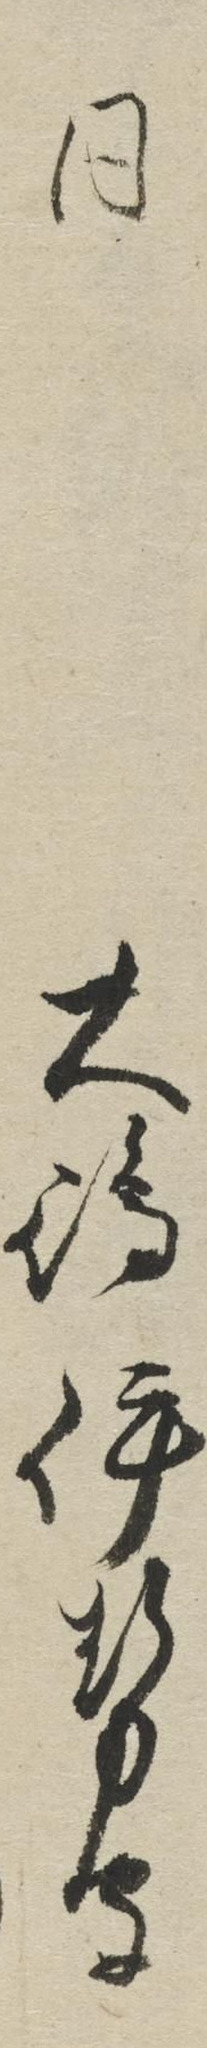同大嶋伊勢守
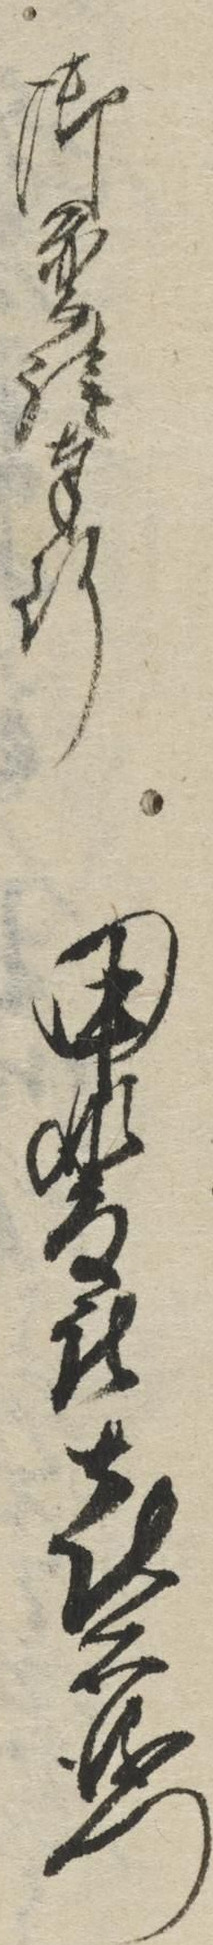御普請奉行甲斐庄喜右衛門
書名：元禄地震記
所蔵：東京大学地震研究所図書室 Earthquake Research Institute Library, The University of Tokyo, JAPAN
